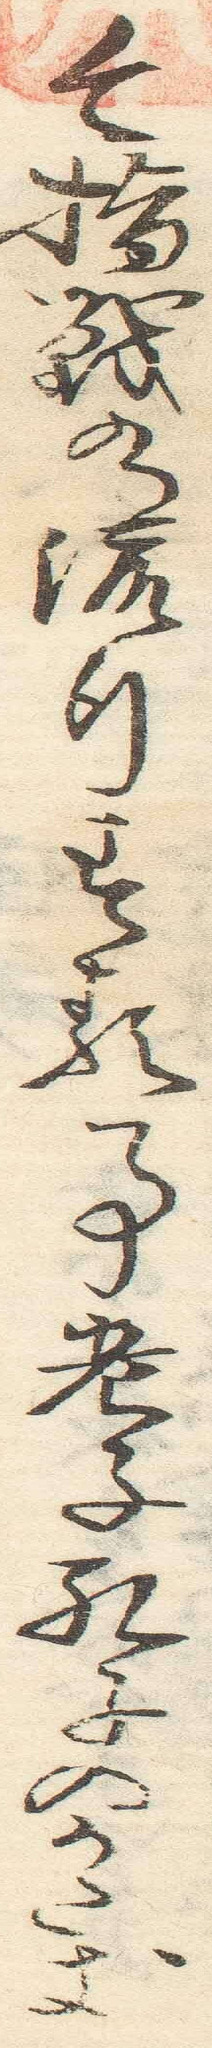今指戦の流行する事老子孔子のかたき
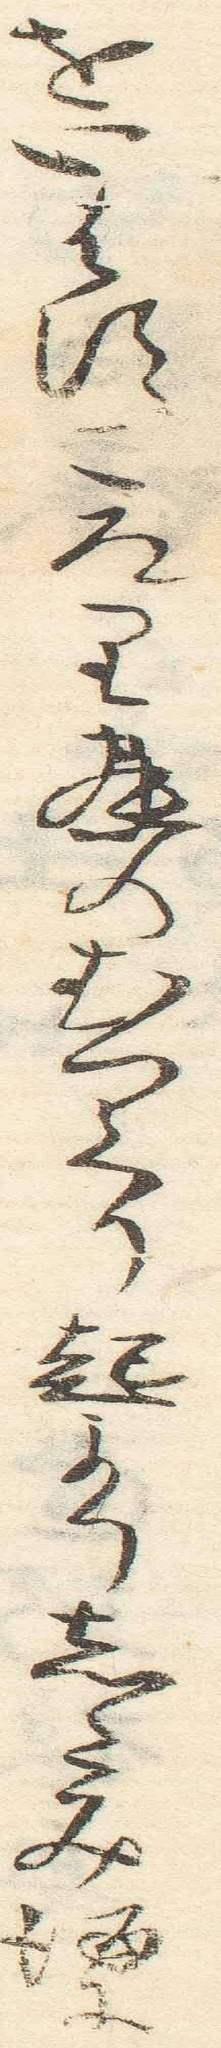をいはすころり寐のむつくり起よりしたみ酒に
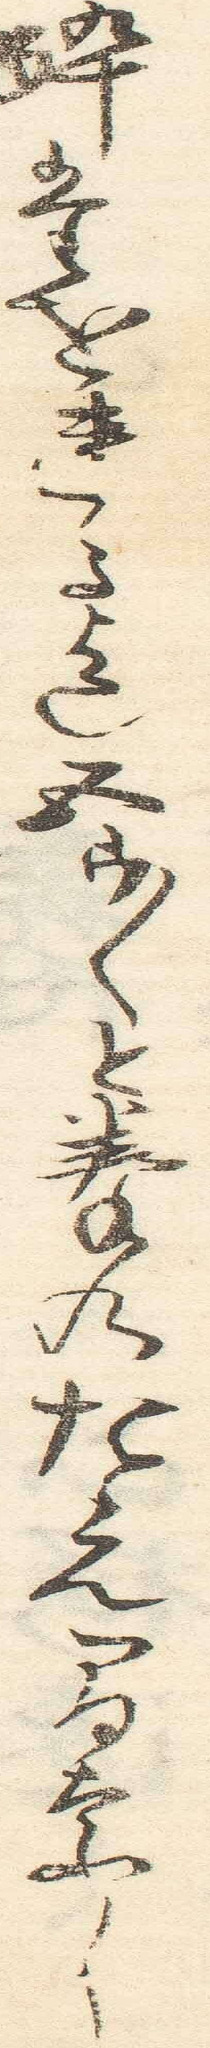酔たをれる迄五ゥ〳〵と拳のたえ間なし
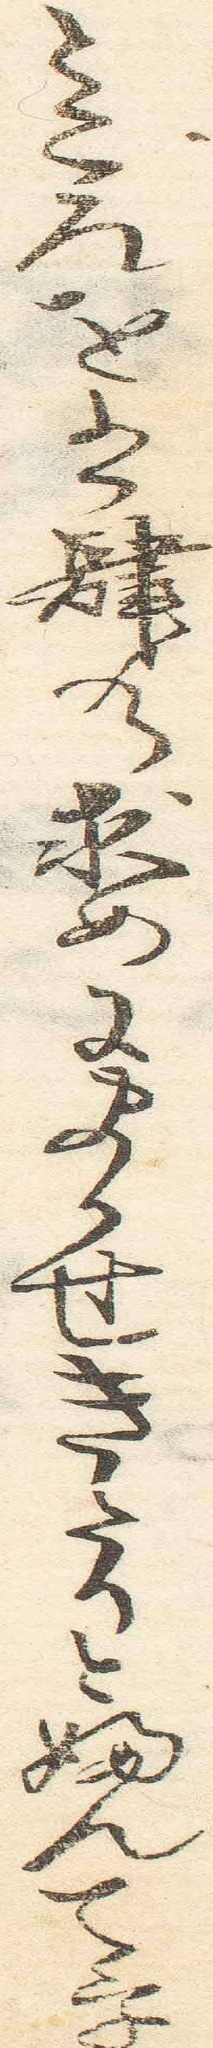ところを書肆の求めにまかせきたりとふんてを
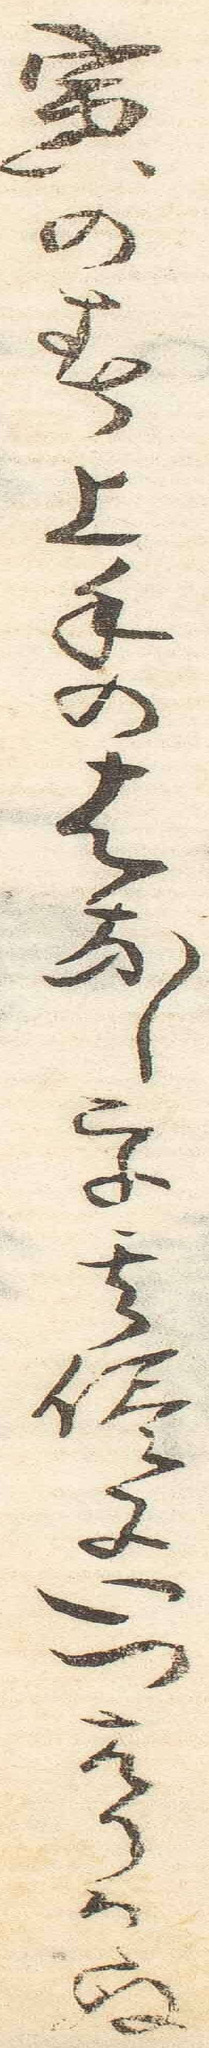寅の春上手のはなしを其儘にいつはりかな
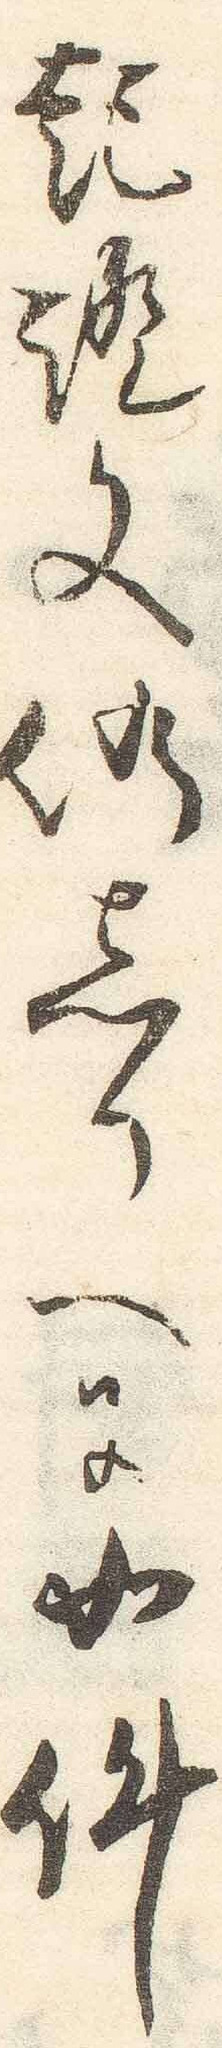き証文仍しりへに如件
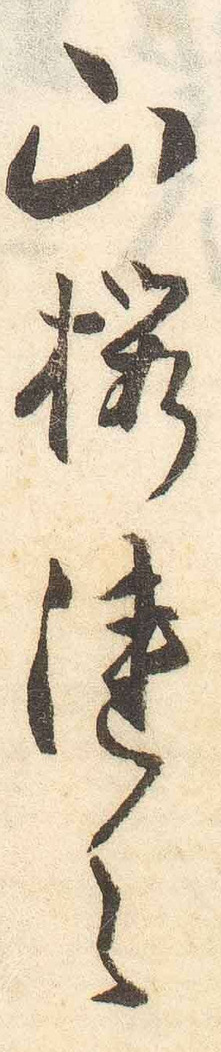山桜漣々
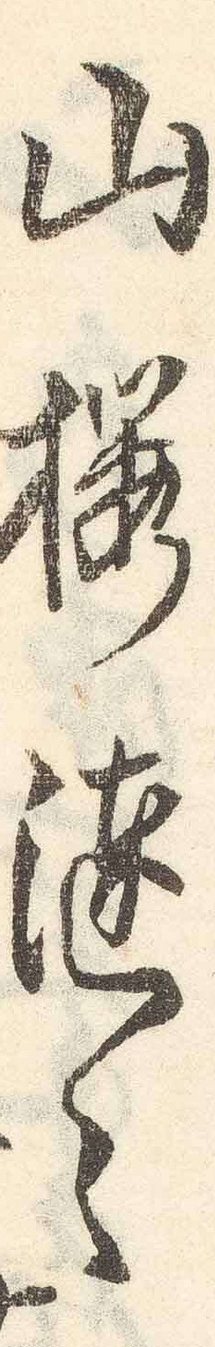山桜漣々
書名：拳独稽古
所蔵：東京学芸大学附属図書館 国文学研究資料館
